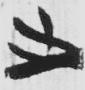之
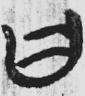曰
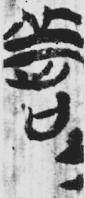善善
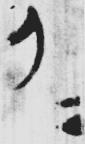人人
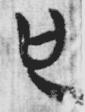也
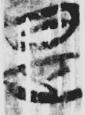是
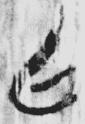㠯（以）
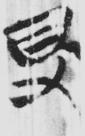○（得）
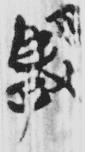○（賢）
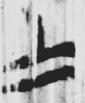士
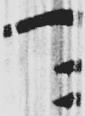一一
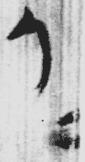人人
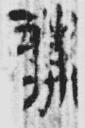譽
